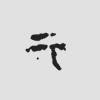亓（其）
